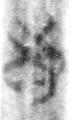志
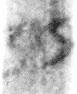多
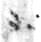之
